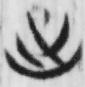出
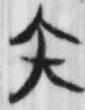內（入）
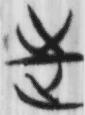寺（侍）
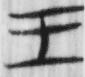王
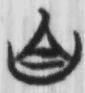自
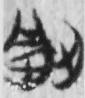○（荆）
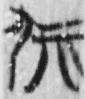𫵖
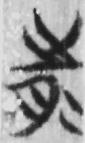之月
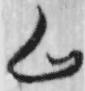㠯（以）
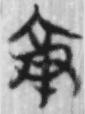○（就）
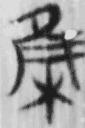集
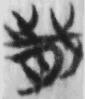歲（歲）
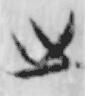之
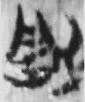○（荆）
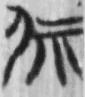𫵖
